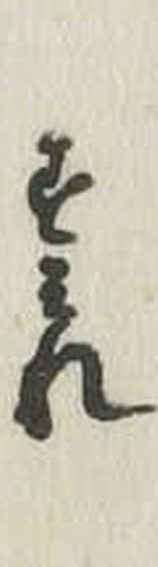すみれ
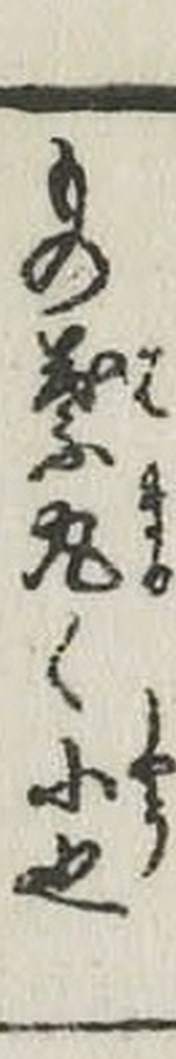もの葉丸く小也
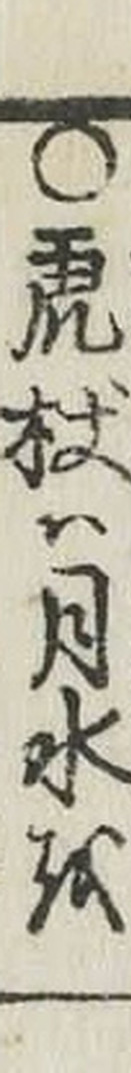○虎杖は月水を
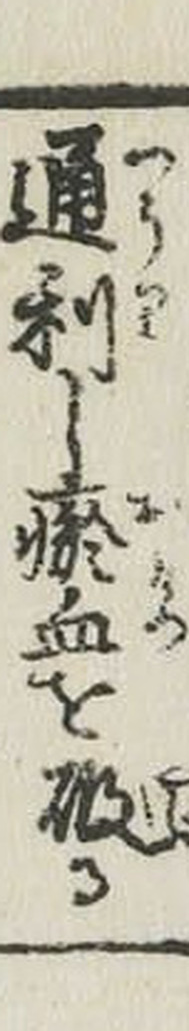通利し瘀血を破る
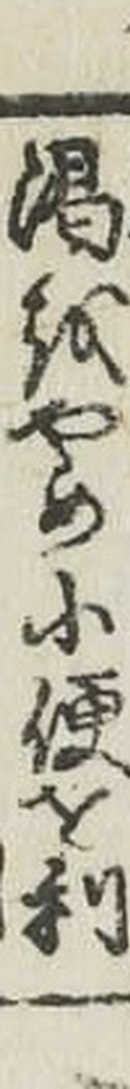渇をやめ小便を利し
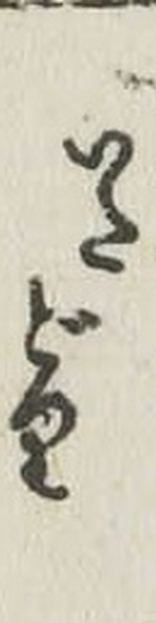いたどり
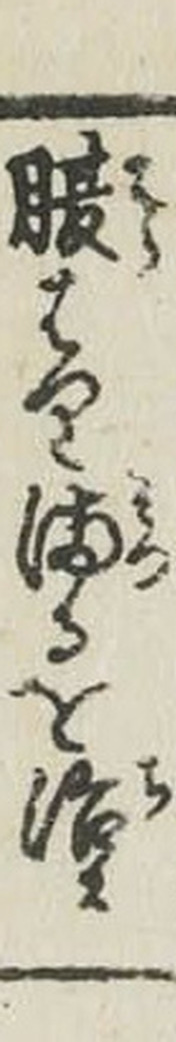腹はり満るを治す
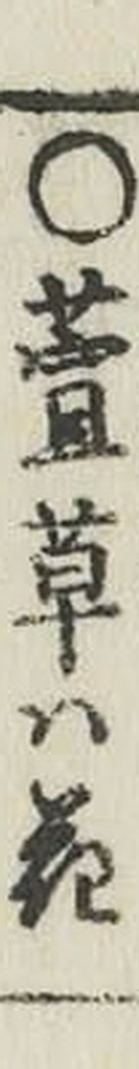○萱草は花
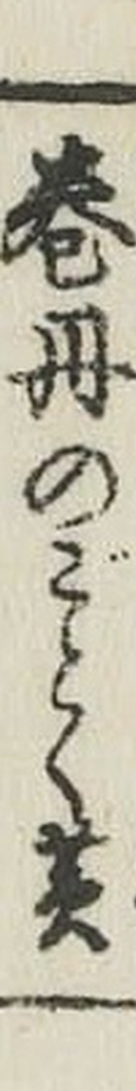巻丹のごとく黄
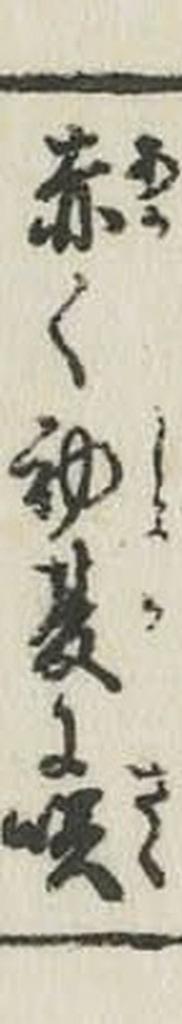赤く初夏に咲
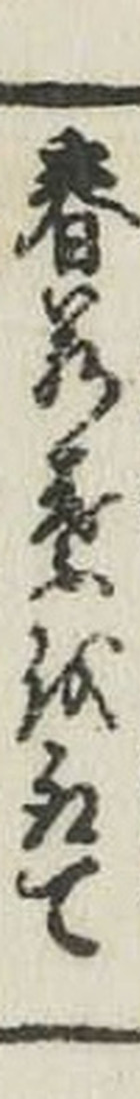春若葉を取て
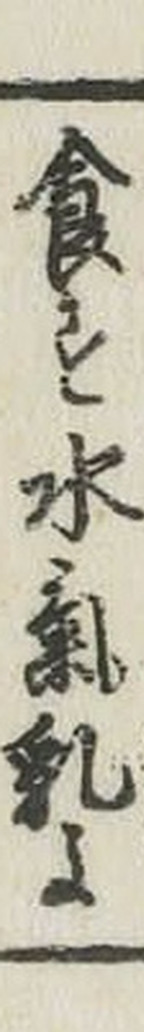食す水気乳よ
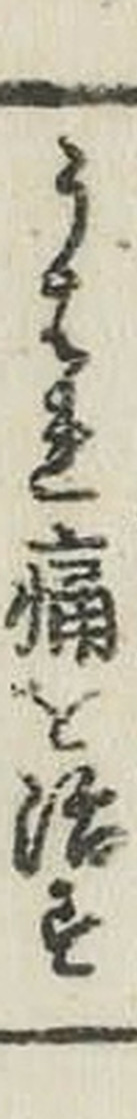うはれ痛を治す
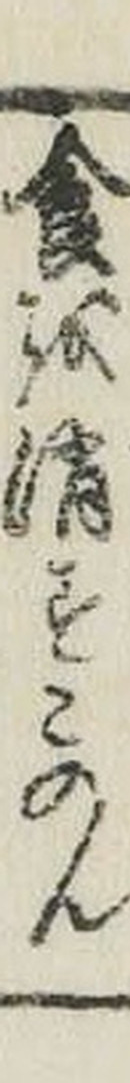食を消すこのん
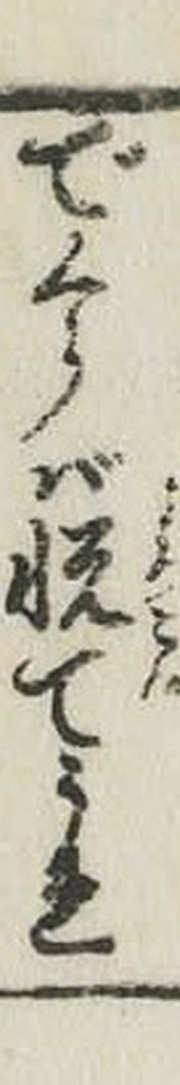でくらば悦てうれ
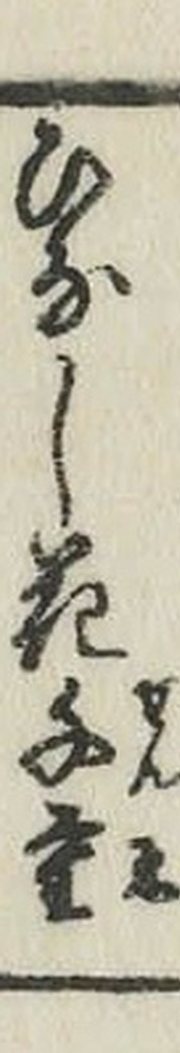ひなし花千重
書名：増補頭書訓蒙図彙大成 10巻 9:巻之20
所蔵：東京学芸大学教育コンテンツアーカイブ
